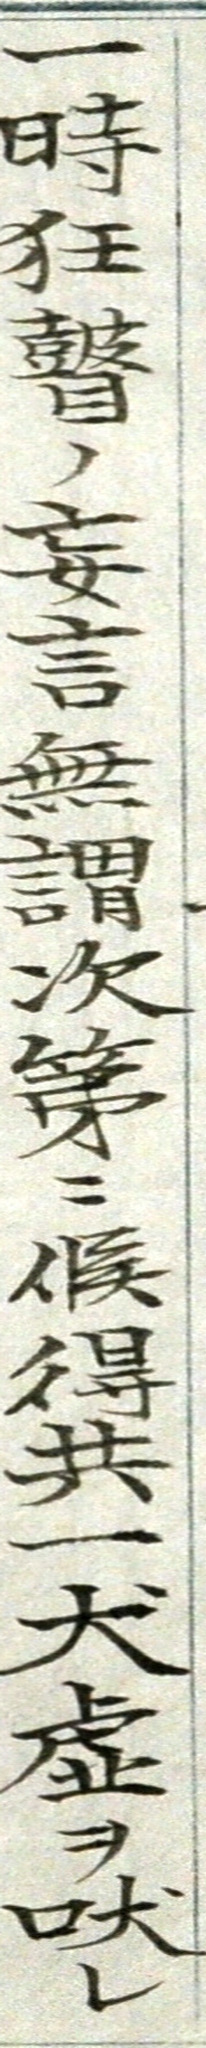一時狂瞽ノ妄言無謂次第ニ候得共一犬虚ヲ吠レ
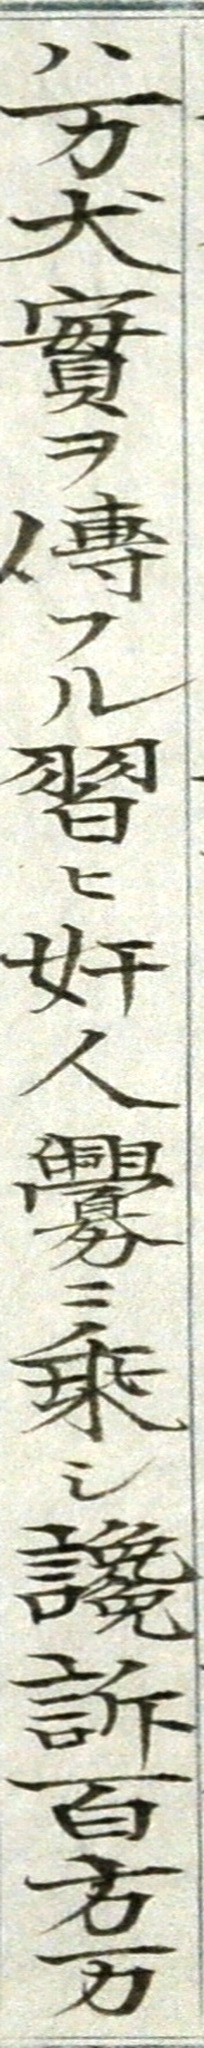ハ万犬実ヲ伝フル習ヒ奸人釁ニ乗シ讒訴百方万
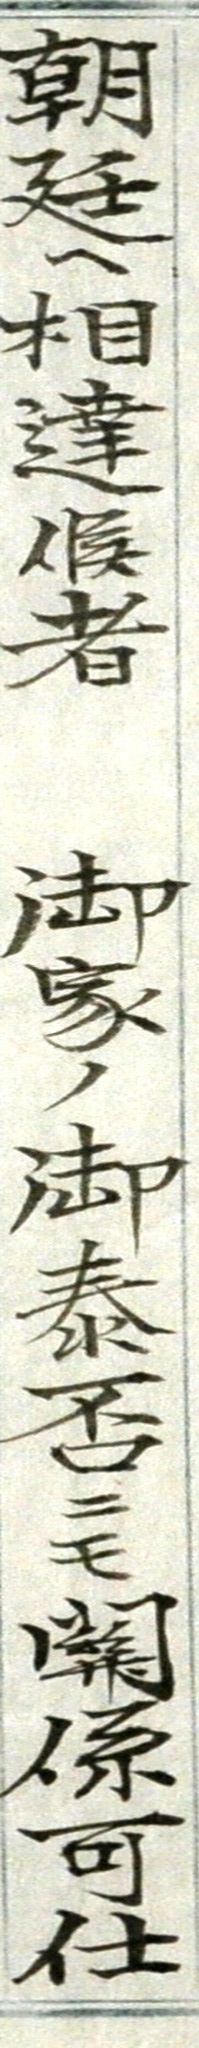朝廷ヘ相違候者御家ノ御泰否ニモ関係可仕
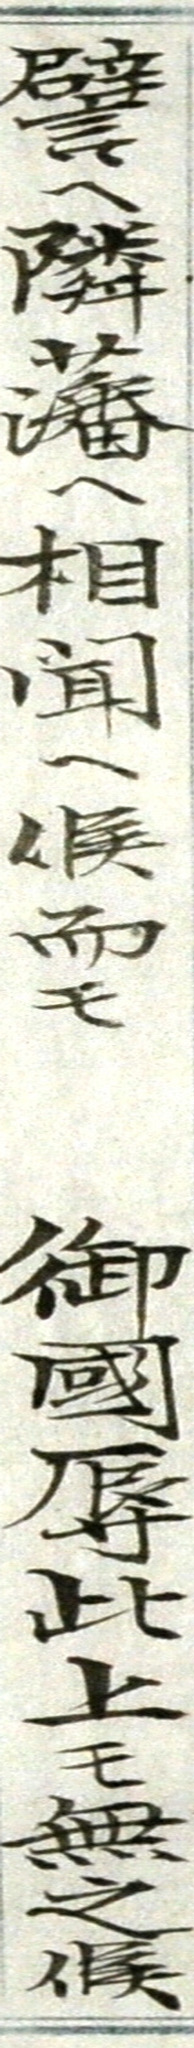譬ヘ隣藩ヘ相聞ヘ相当而モ御国辱此上モ無之候
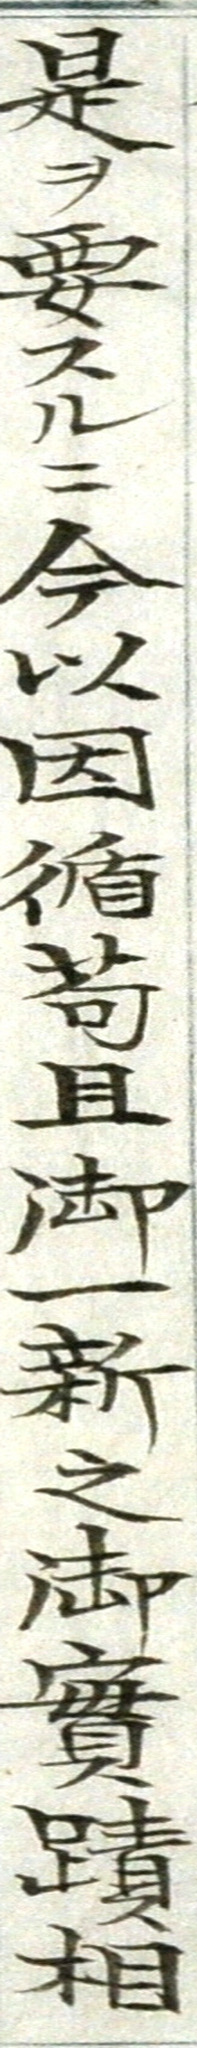是ヲ要スルニ今以因循荀且御一新之御実蹟相
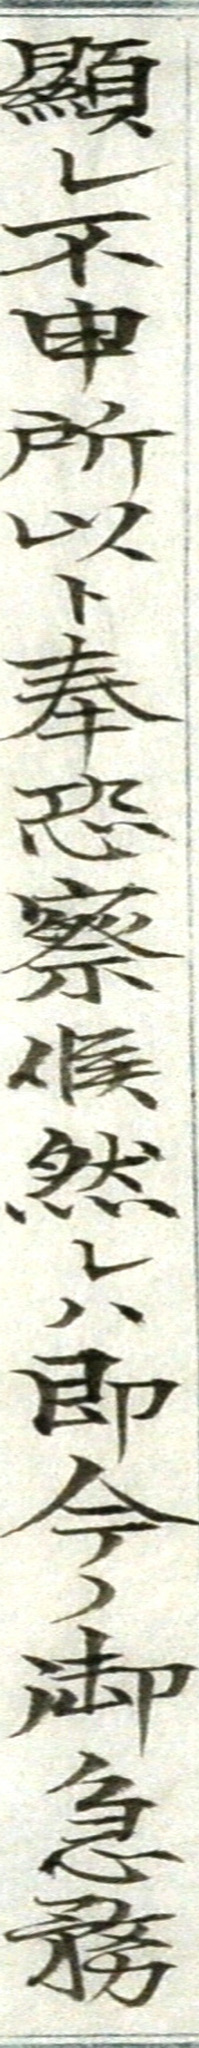顕レ不申所以ト奉恐察候然レハ即今ノ御急務
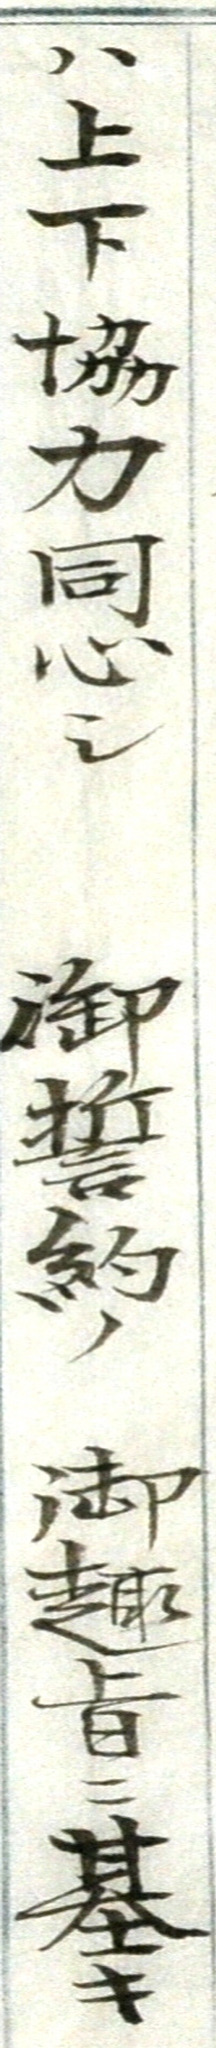ハ上下協力同心シ御誓約ノ御趣旨ニ基キ
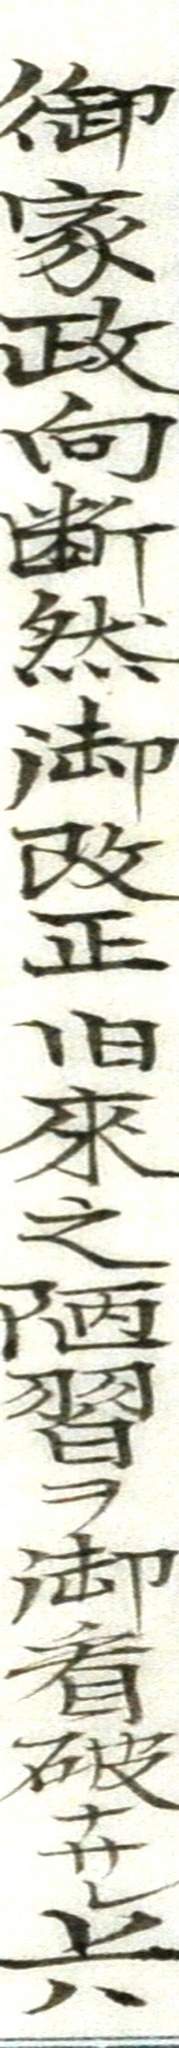御家政向断然御改正旧来之陋習ヲ御看破ナサレ上ハ
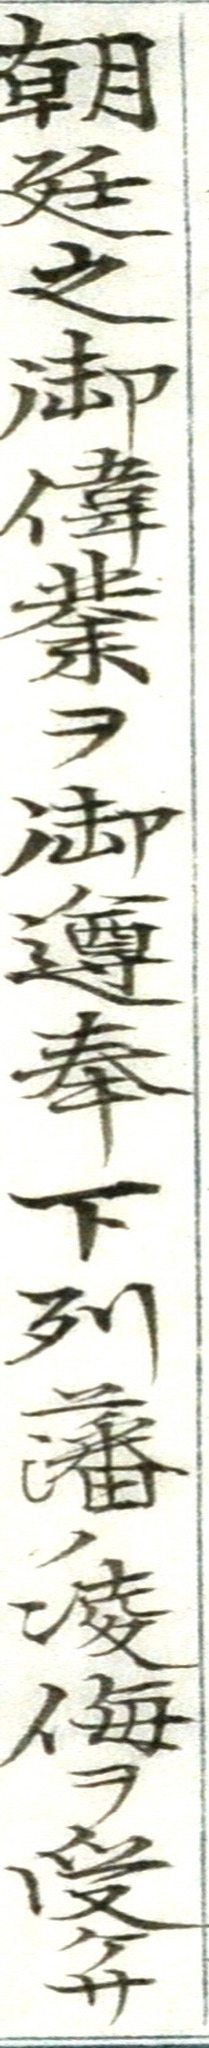朝廷之御偉業ヲ御遵奉下列藩ノ凌悔ヲ受ケサ
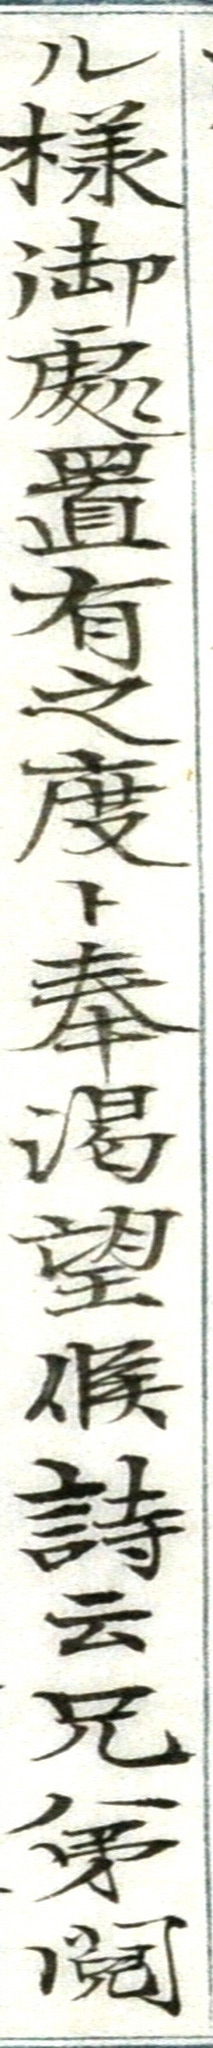ル様御処置有之度ト奉渇望候詩云兄ハ弟閲
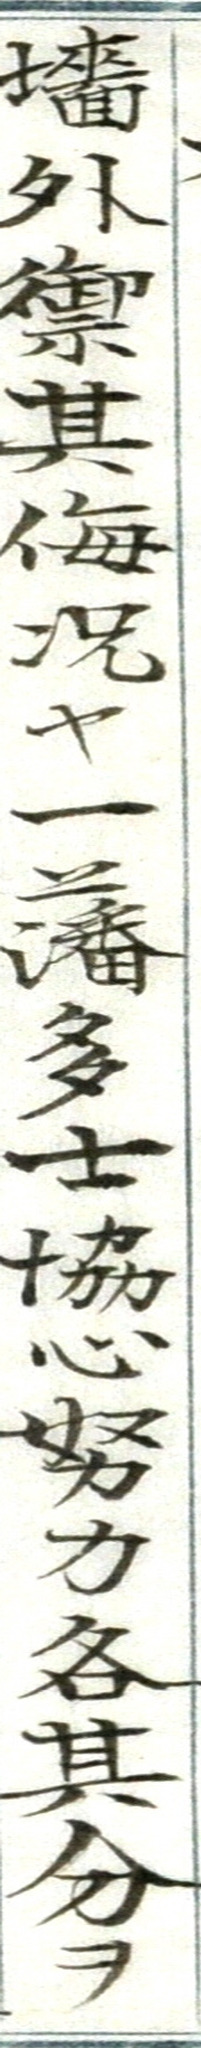墻外禦其侮况ヤ一藩多士共協心努力各其分ヲ
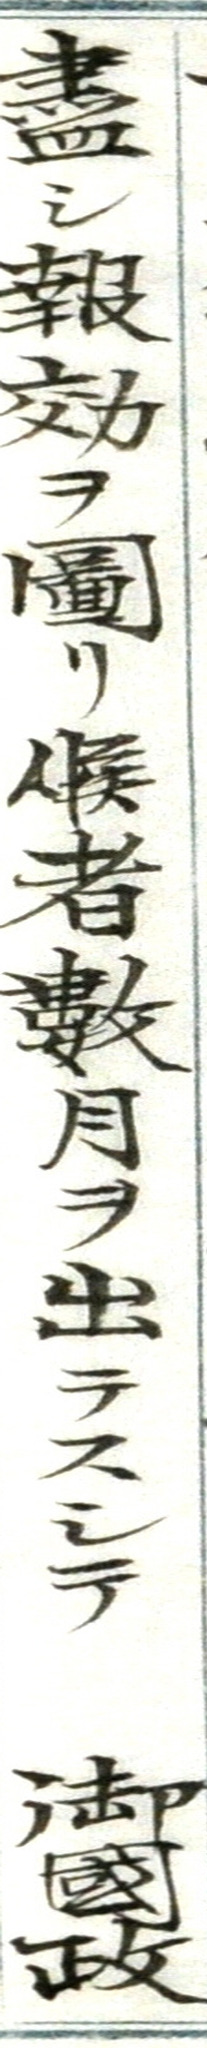尽シ報効ヲ図リ候者数月ヲ出テスシテ御国政
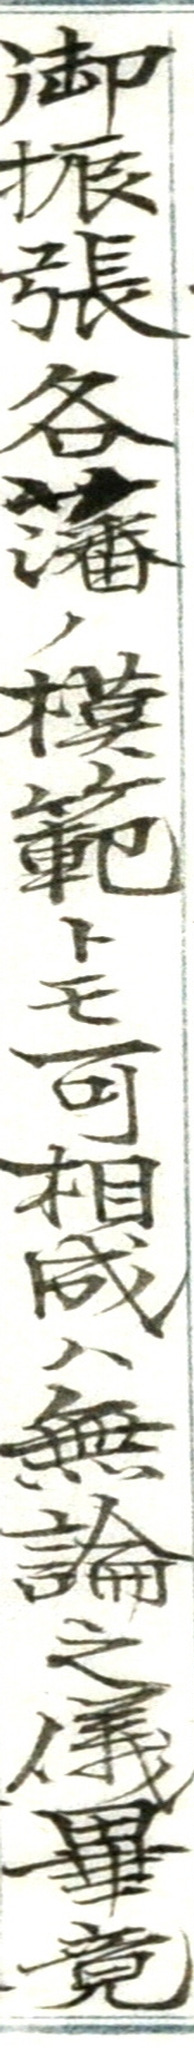御振張各藩ノ模範トモ可相成ハ無論之儀畢竟
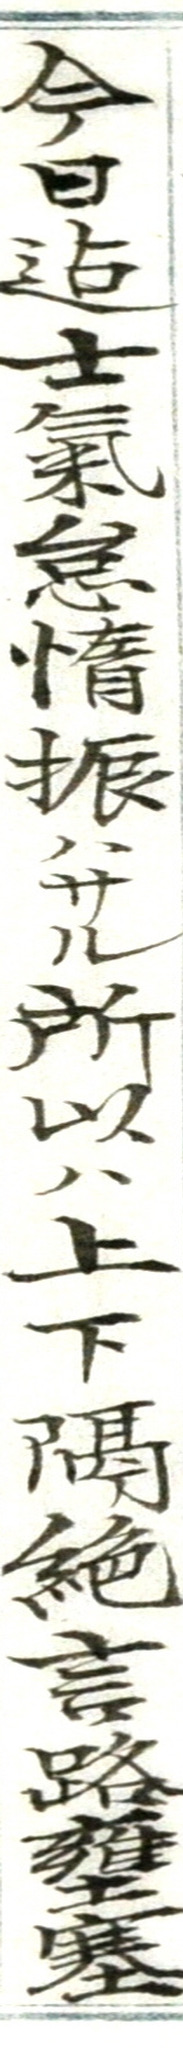今日迄士気怠惰振ハサル所以ハ上下隔絶言路壅塞
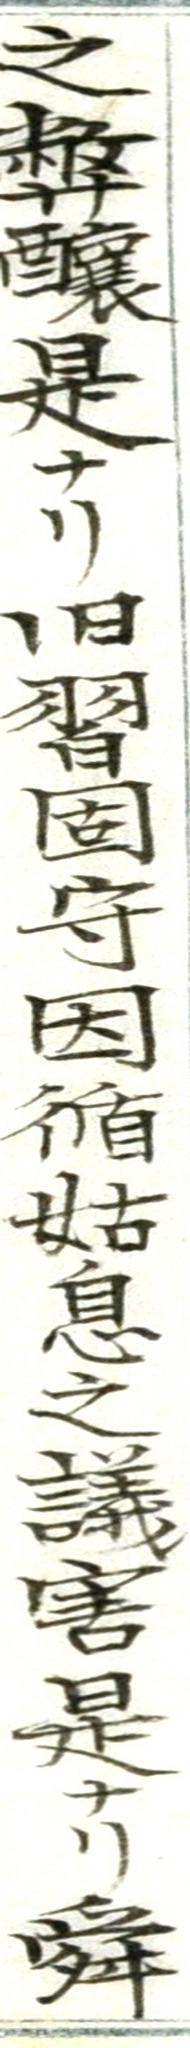之弊醸是ナリ旧習固守因循姑息之議害是ナリ舜
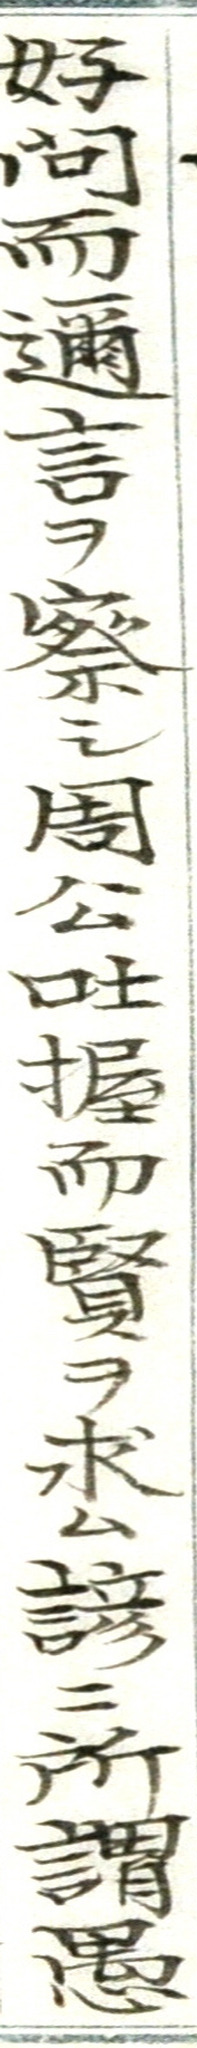好問而邇言ヲ察シ周公吐握而賢ヲ求ム諺ニ所謂愚
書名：高遠藩執政ニ提出セシ建議書
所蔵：伊那市立高遠町図書館・合同会社AMANE
